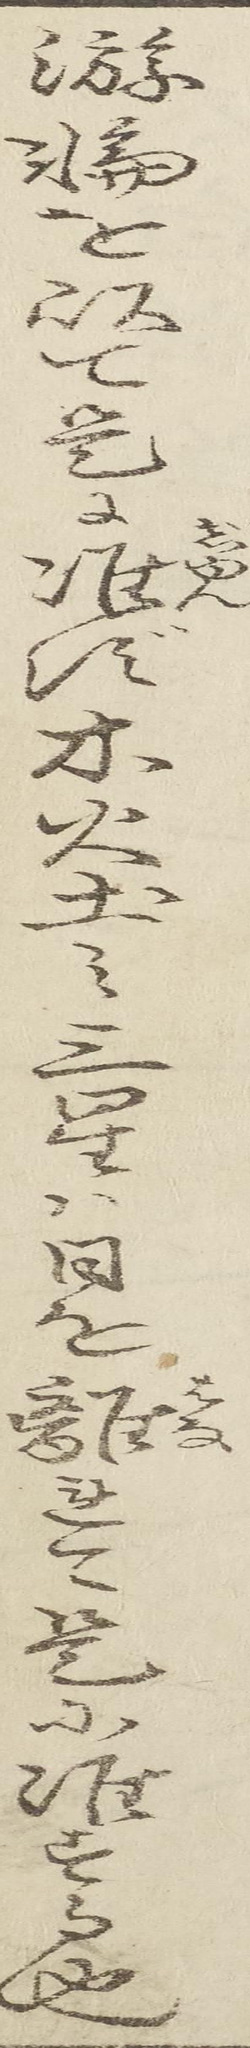游輪を以て是に准ず木火土之三星は日を離れて是に准する也

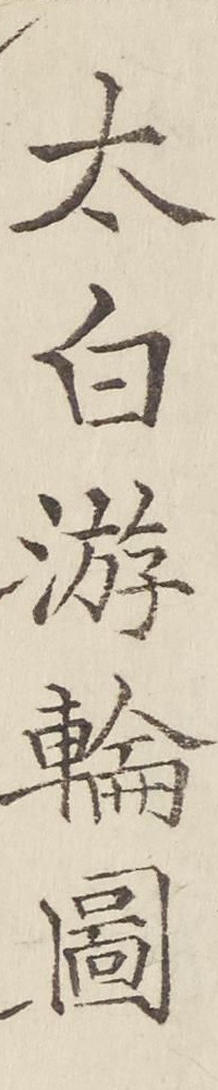太白游輪図
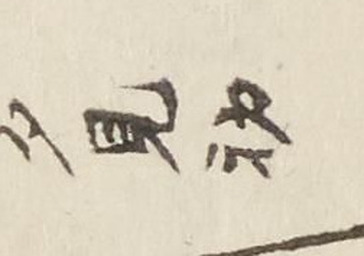晨見初
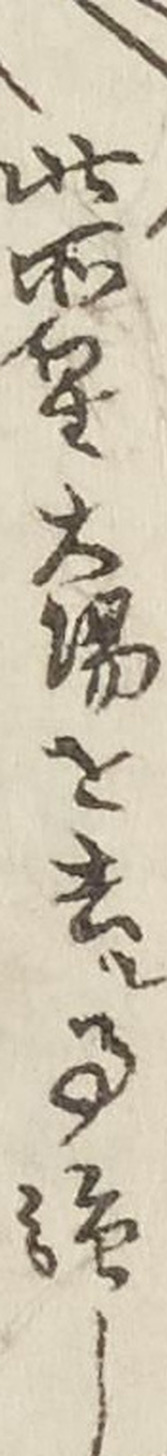此所星大陽を去ル事強し
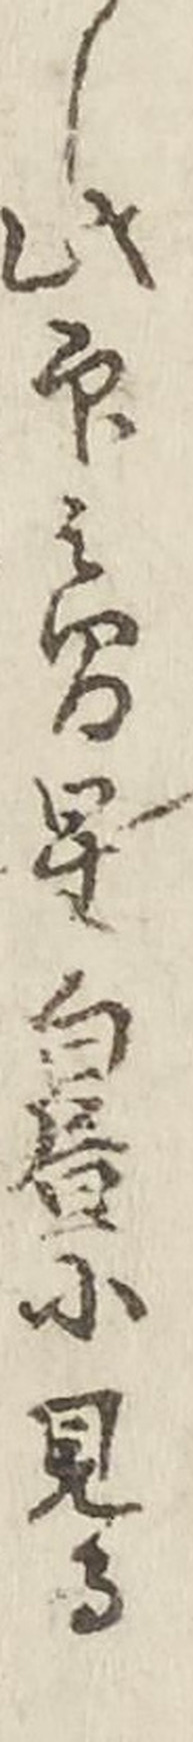此印之間星白昼に見る
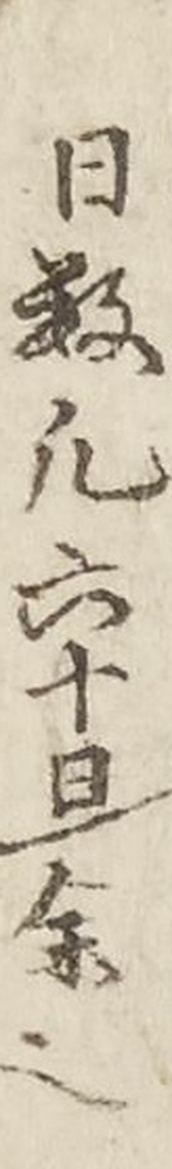日数凡六十日余也
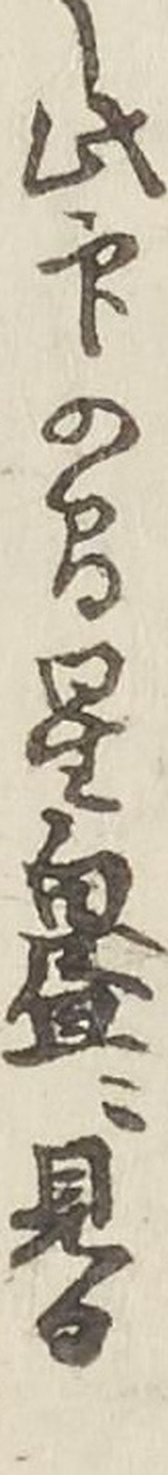此印の間星白昼に見る
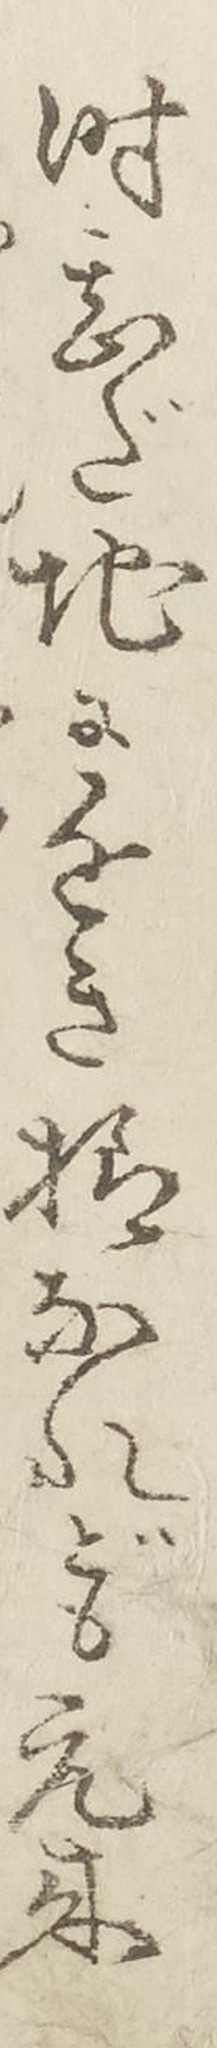時甚だ地に近き様になれども元来
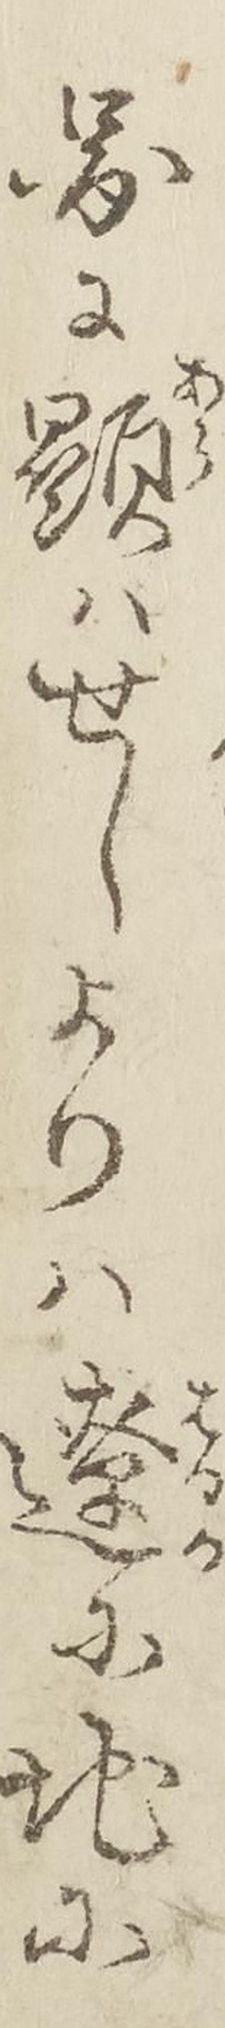図に顕はせしよりは遥に地に
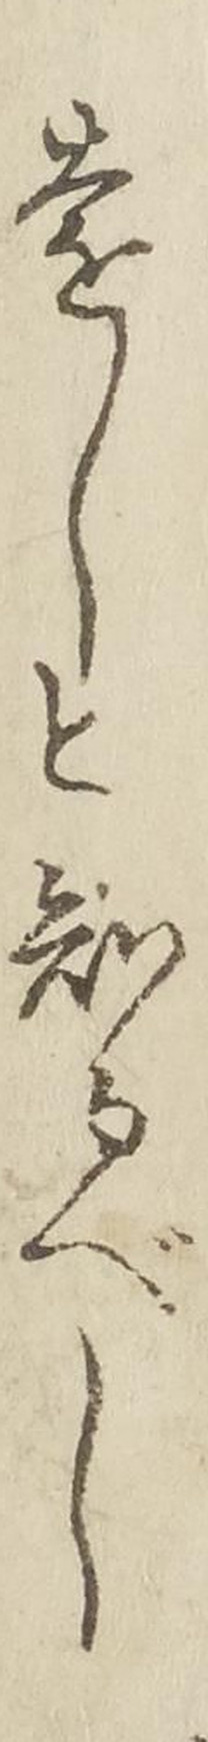遠しと知るべし

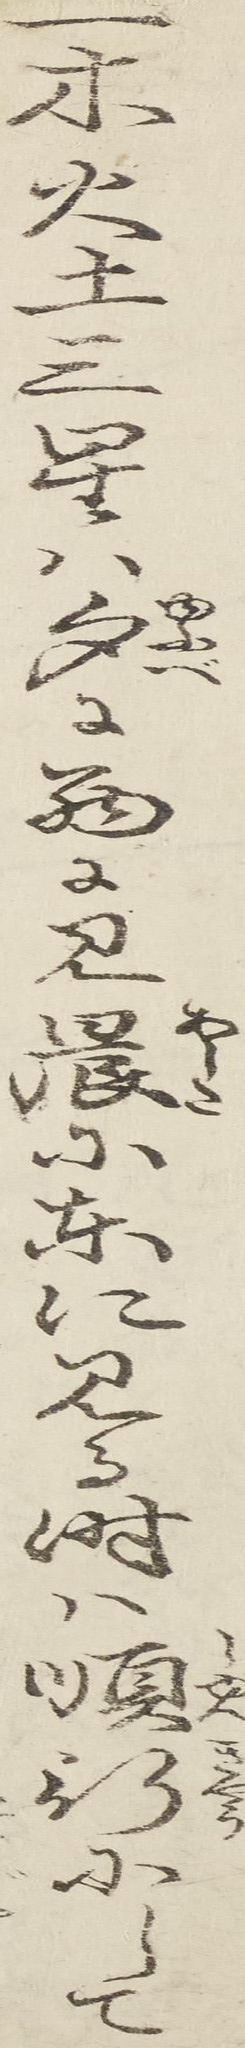一木火土三星は夕に西に見晨に東に見る時は順行にして
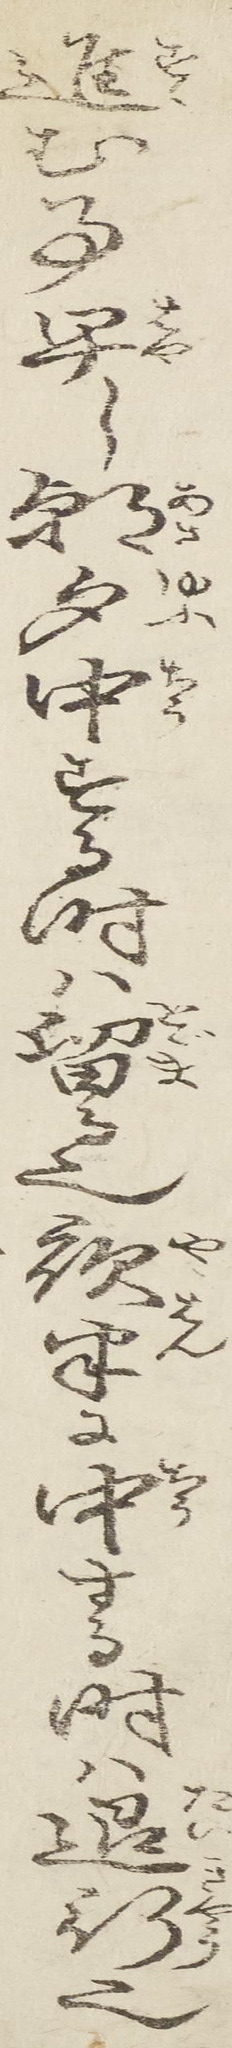進む事早し朝夕中する時は留る也夜半に中する時は退行也
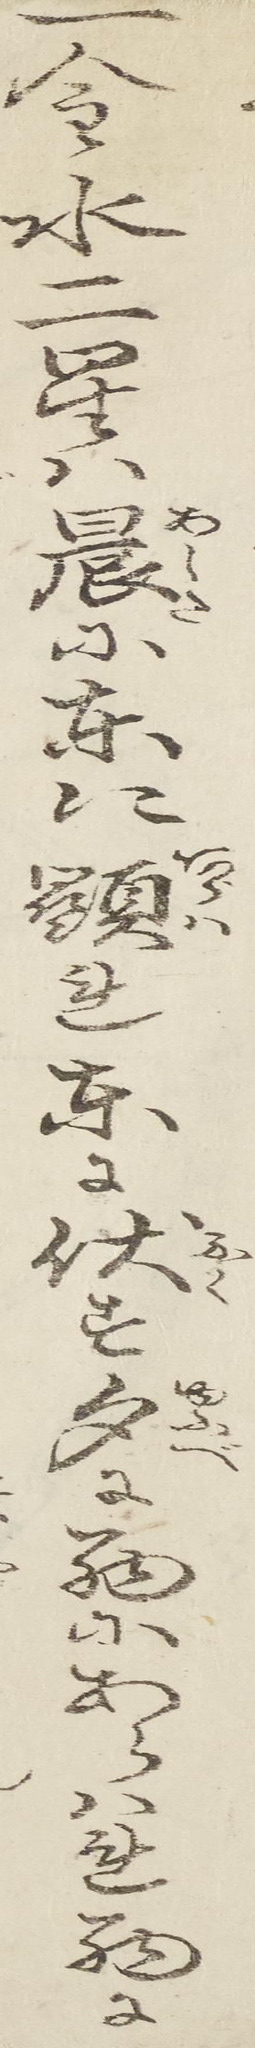一金水二星は晨に東に顕れ東に伏す夕に西にあらはれ西に
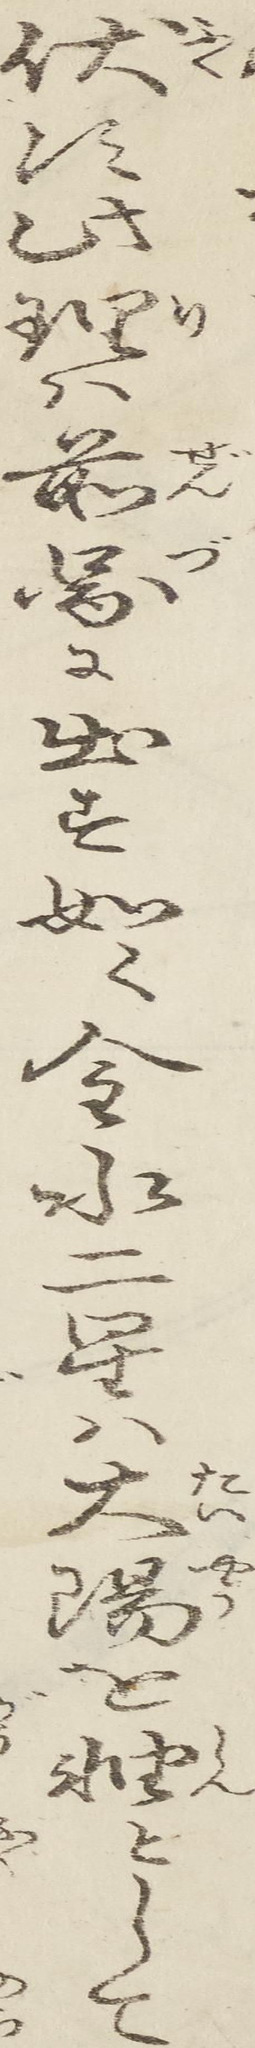伏す此理は前図に出す如く金水二星は大陽を軸として
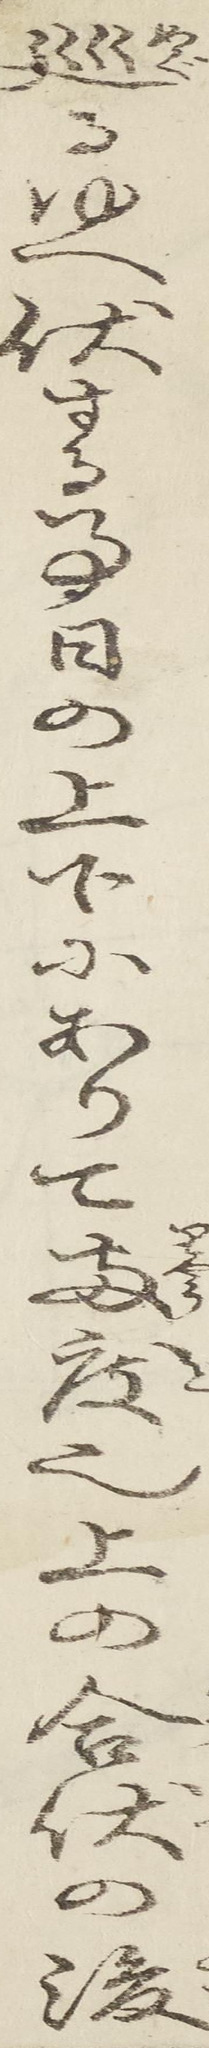巡るゆへ伏する事日の上下にありて両度也上の合伏の後
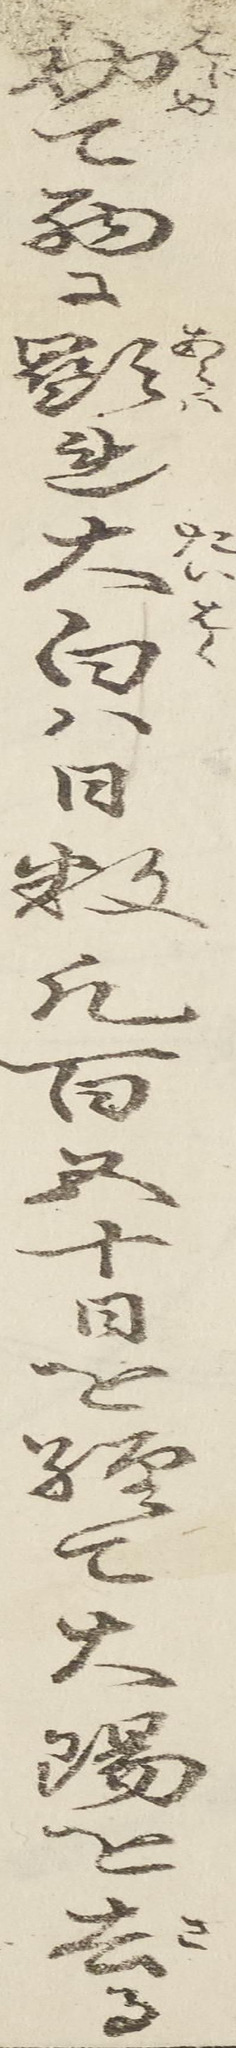初て西に顕れ大白は日数凡百五十日を経て太陽を去る
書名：平天儀圖解
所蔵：東京大学地震研究所図書室 Earthquake Research Institute Library, The University of Tokyo, JAPAN
